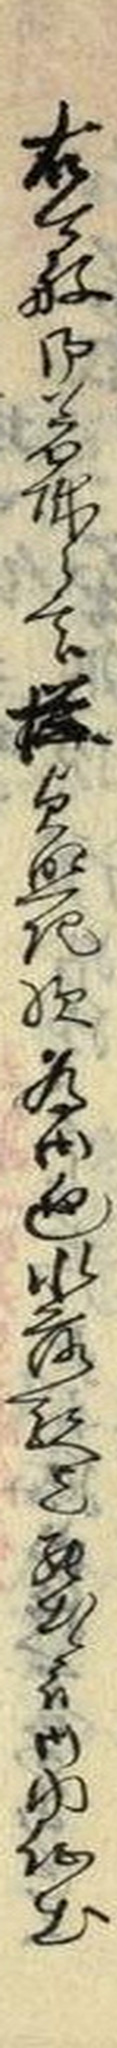右今般御着城之節従貞照院様為御迎水落駅迄罷出候ニ付御内証出
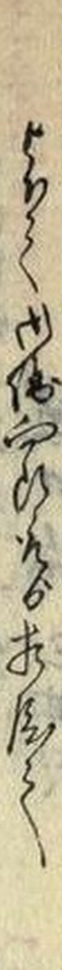被下之御側向頭取ゟ相渡之
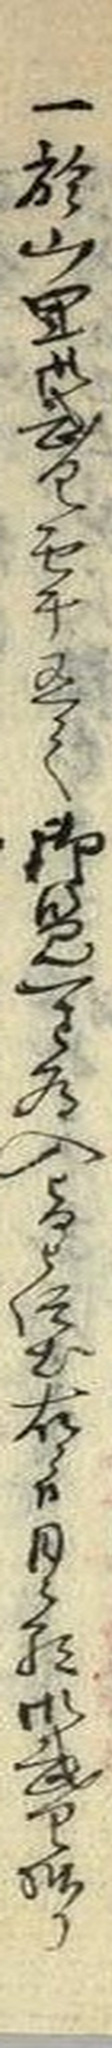一於山里御武具虫干有之御覧可被為入旨被仰出右ニ付日之程御武具掛り
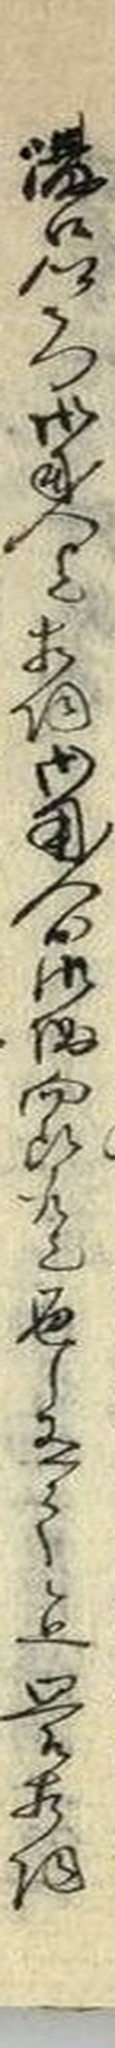溝口郷右衛門御用人迄相伺御用人ゟ御側向頭取迄通し有之候上思召相伺
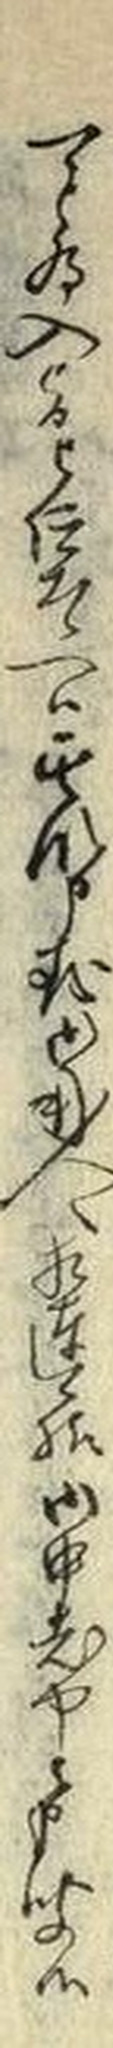可被為入旨被仰出候へハ其段申越御用人へ相達候様御中老中被申聞候
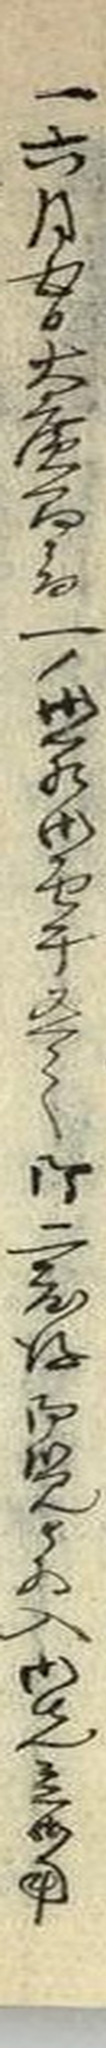一六月五日大広間ニ而一ノ御箱御虫干有之御二度後御覧被為入御先立御用
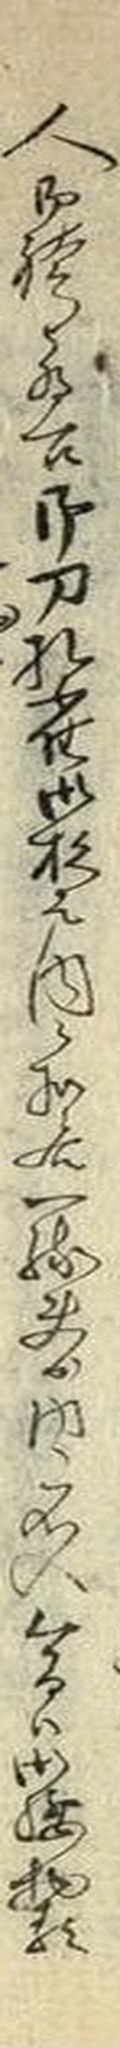人御袴被為召御刀孔雀御杉戸内ニ掛居一統夫ゟ内へ不入今日ハ御腰物類
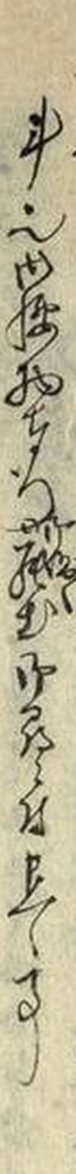斗也御腰物奉行〇御側へ罷出御尋ニ付申上候事
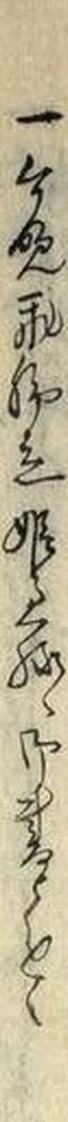一今晩飛脚立姫君様へ御書被進候

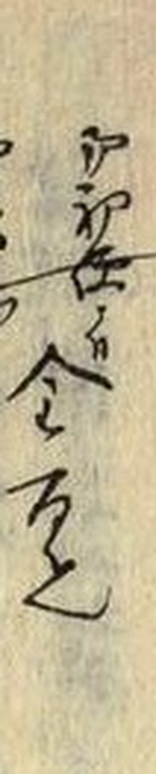御初便ニ付金百疋
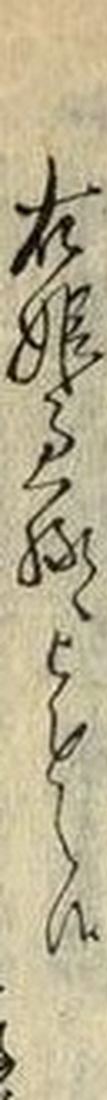右姫君様へ被進之候
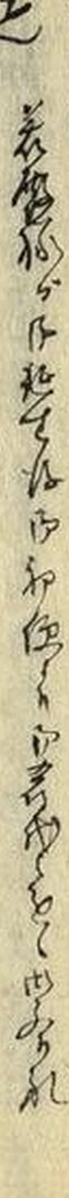金百疋若殿様ゟ御誕生後御初便ニ付御肴代被進候御答礼
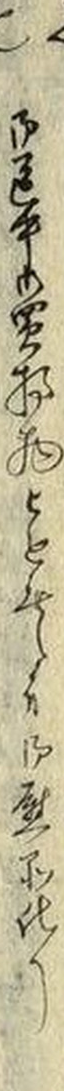金百疋御道中御買揚物被進無之ニ付御慰品代り
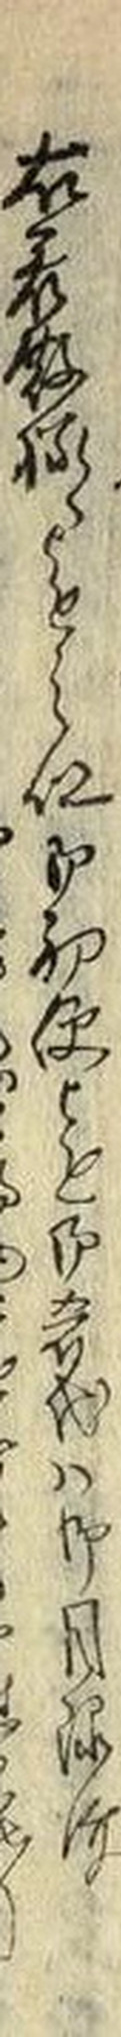右若殿様へ被進之但御初便被進御肴代ハ御目録済
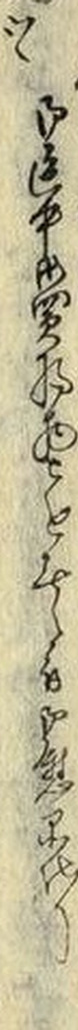金百疋御道中御買揚物被進無之ニ付御慰品代り
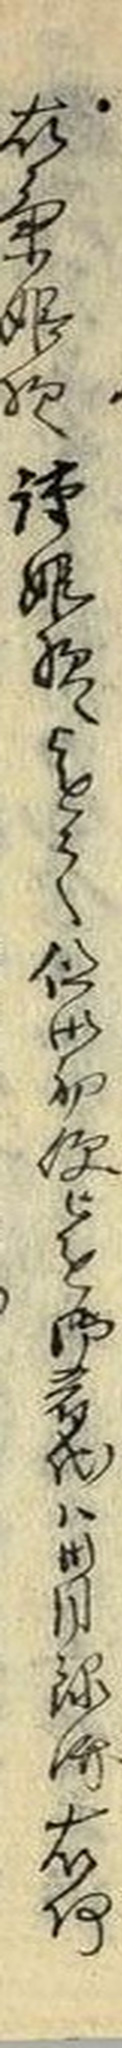右菊姫様謹姫様へ被進之但御初便被進御肴代ハ御目録済右何
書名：少傅日録抄（斉承付側向頭取日記、在国）
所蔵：福井県文書館 Fukui Prefectural Archives
